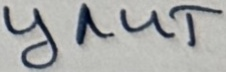улит
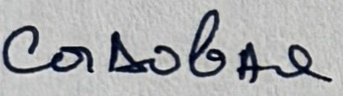садовая
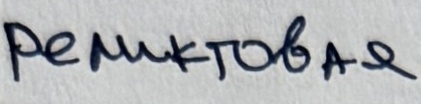реликтовая
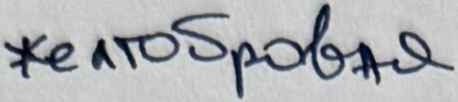желтобровая
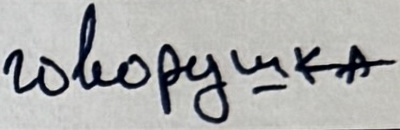говорушка
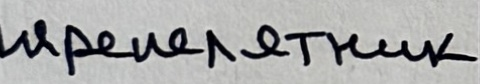перепелятник
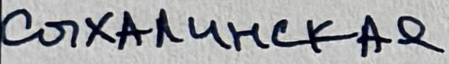сахалинская
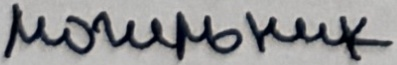могильник
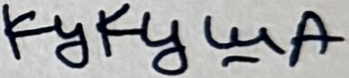кукуша
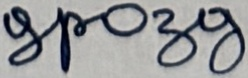дрозд
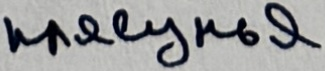плясунья
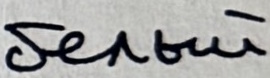белый
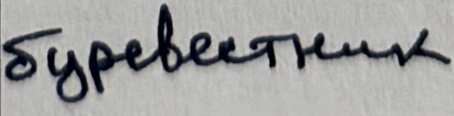буревестник
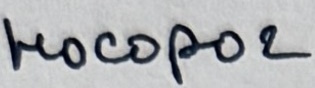носорог
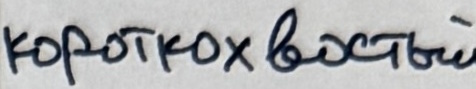короткохвостый
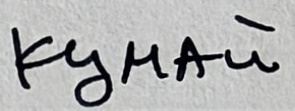кумай
